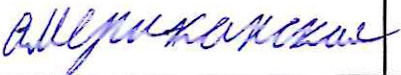американская
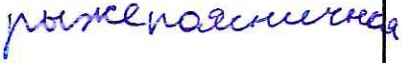рыжепоясничная
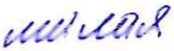малая
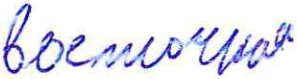восточная
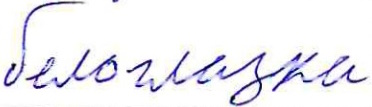белоглазка
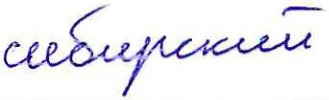сибирский
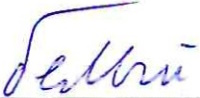белый
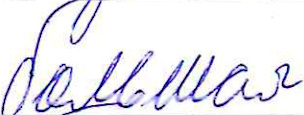большая
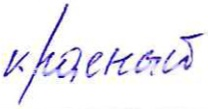красный
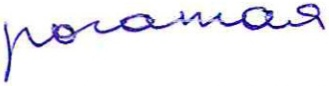рогатая
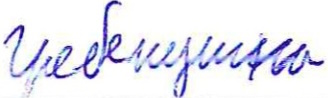гребенушка
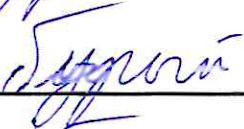бурый
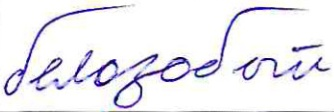белозобый
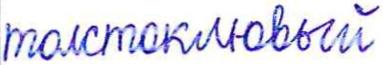толстоклювый
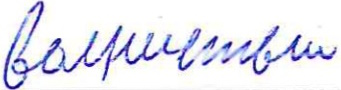волнистыи
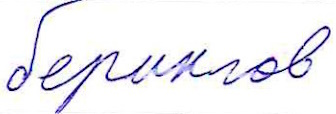берингов
